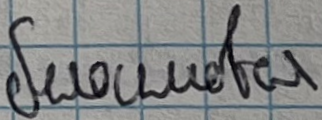белоклювая
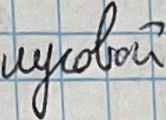луговой
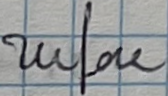чирок
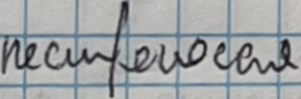пестроносая
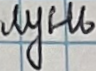лунь
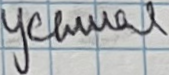усатая
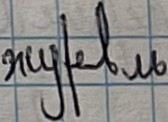журавль
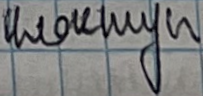клоктун
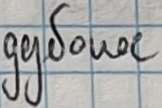дубонос
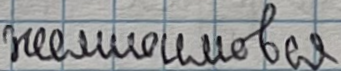желтоклювая
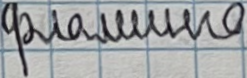фламинго
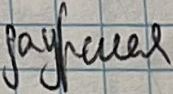даурская
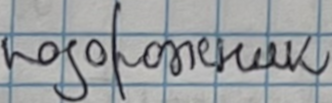подорожник
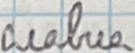славка
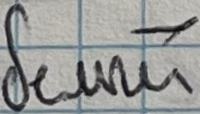белый
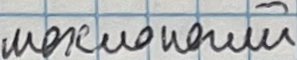мохноногий
